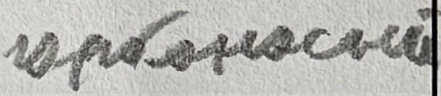горбоносый
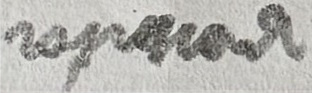горная
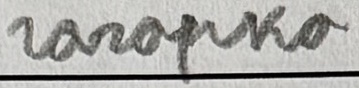гагорка
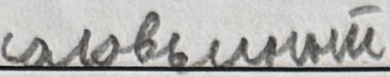соловьиный
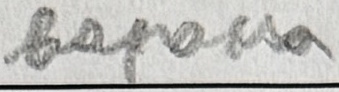ворона
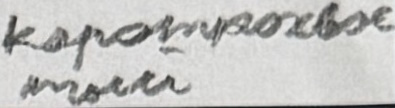кароткохвостый
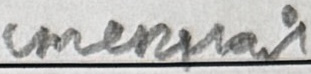степная
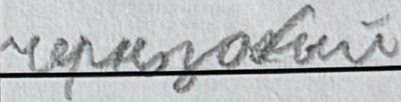чернозобый
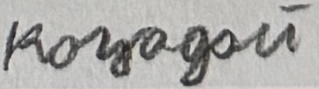козодой
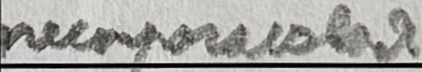пестроголовая
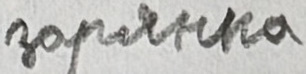зорянка
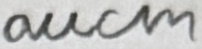аист
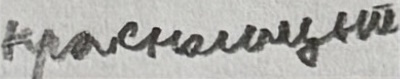краснолицый
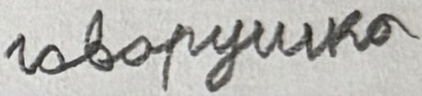говорушка
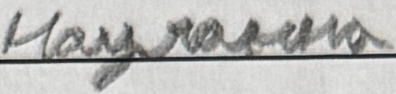науманна
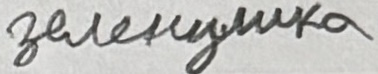зеленушка
